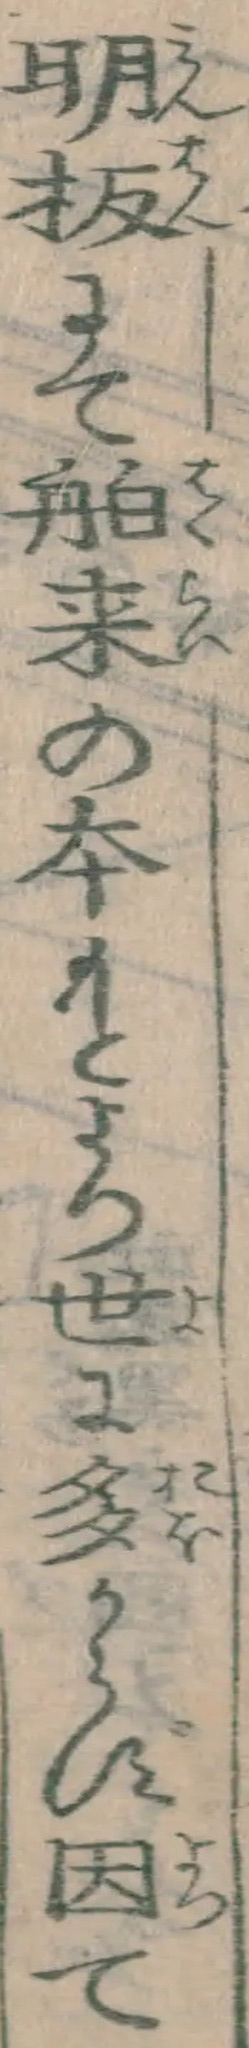明板にて舶来の本もとより世に多からず因て
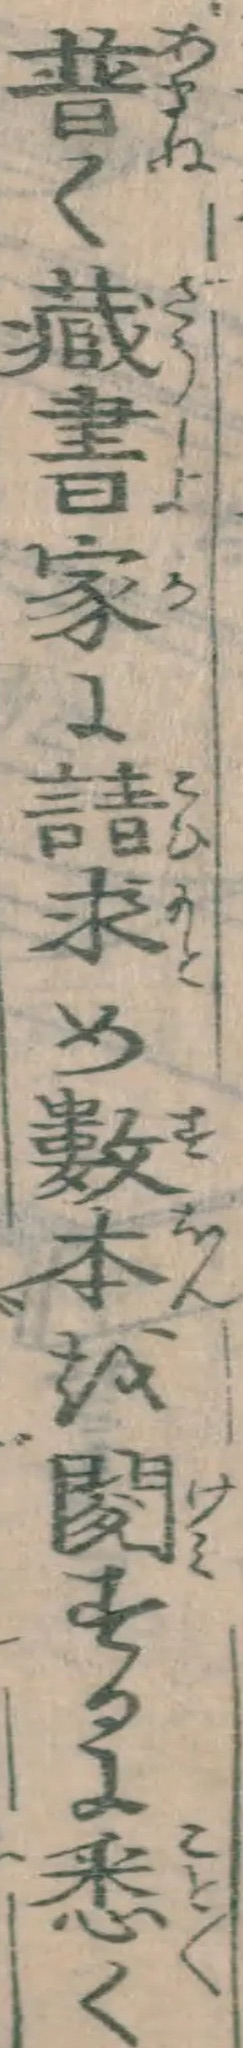普く蔵書家に請求め数本を閲するに悉く
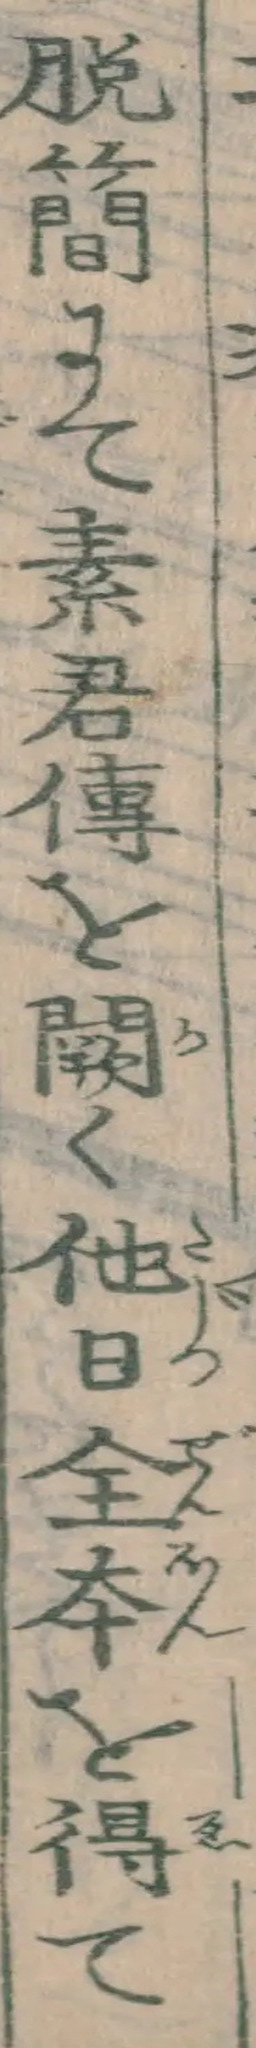脱簡にて素君伝を闕く他日全本を得て
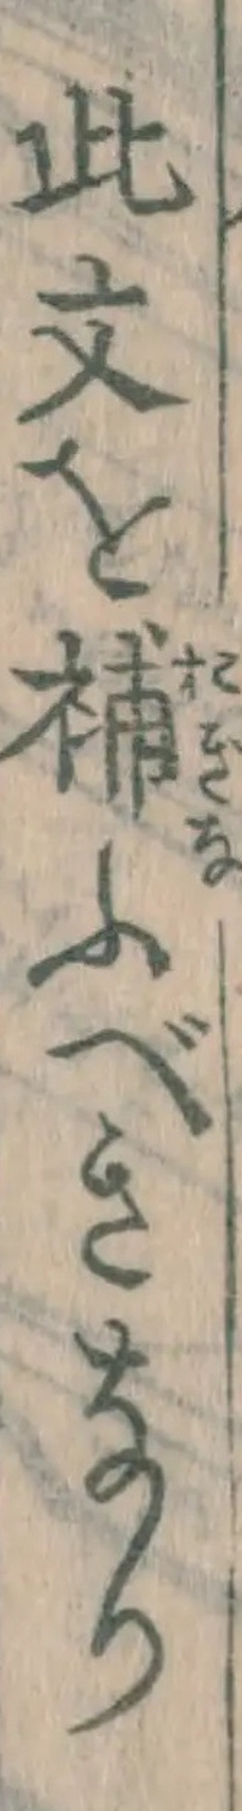此文を補ふべきなり
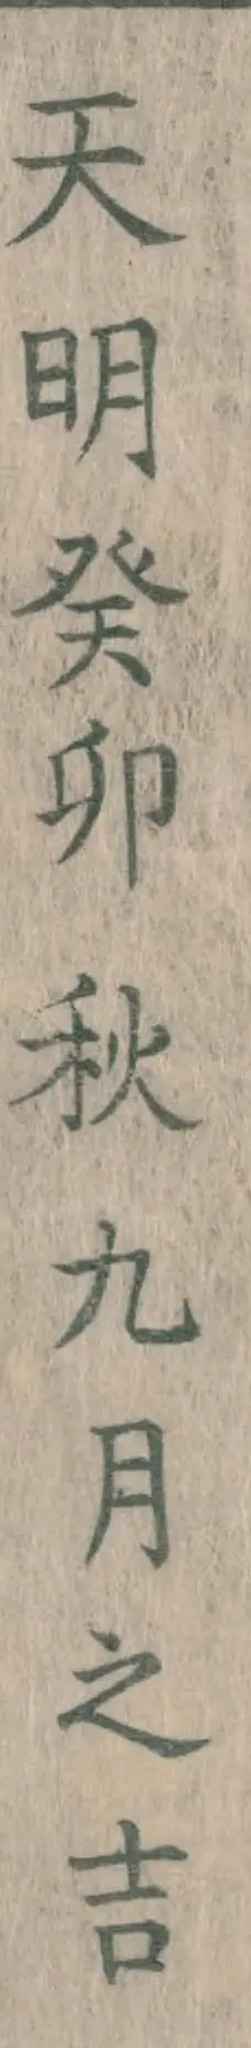天明癸卯秋九月之吉
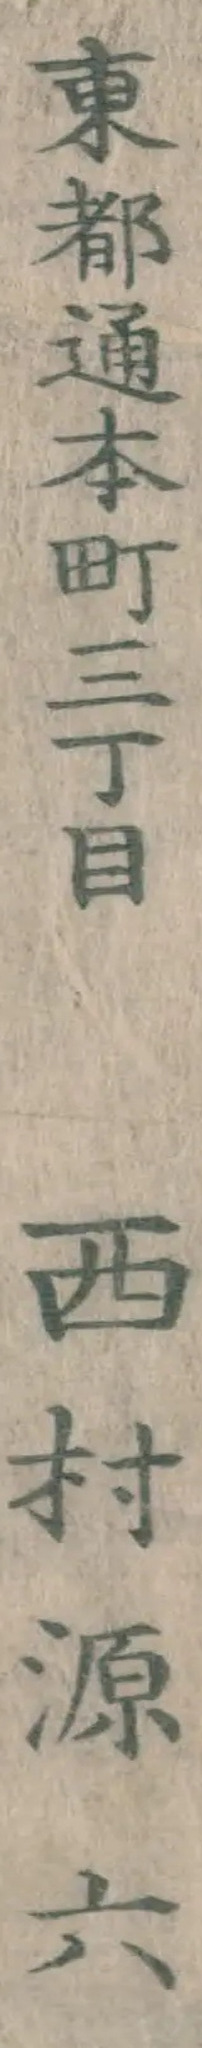東都通本町三丁目西村源六
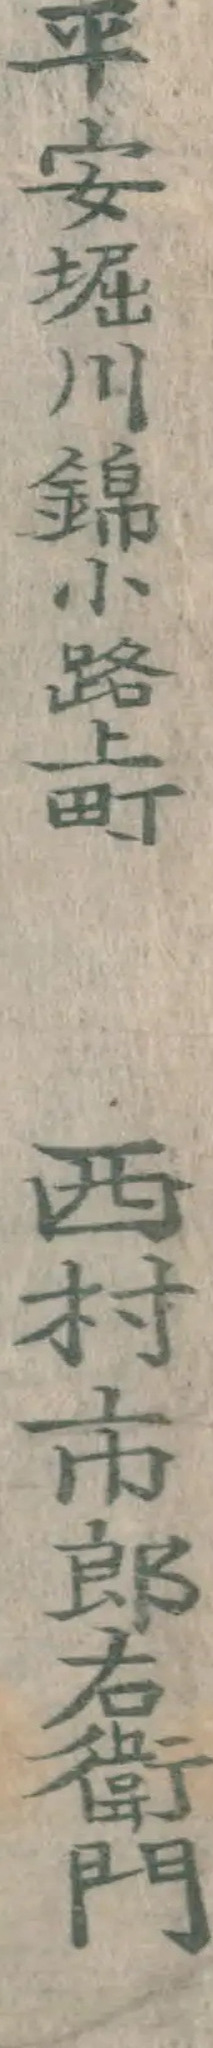平安堀川錦小路上町西村市郎右衛門
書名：豆腐百珍. 続編
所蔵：国立国会図書館 National Diet Library, JAPAN
